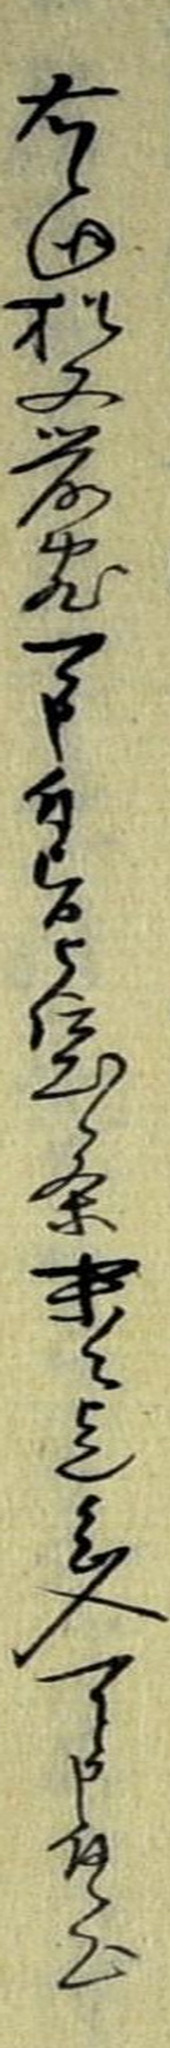右之趣猶又厳敷可申付旨被仰出候条末々迄念入可被申付候以上
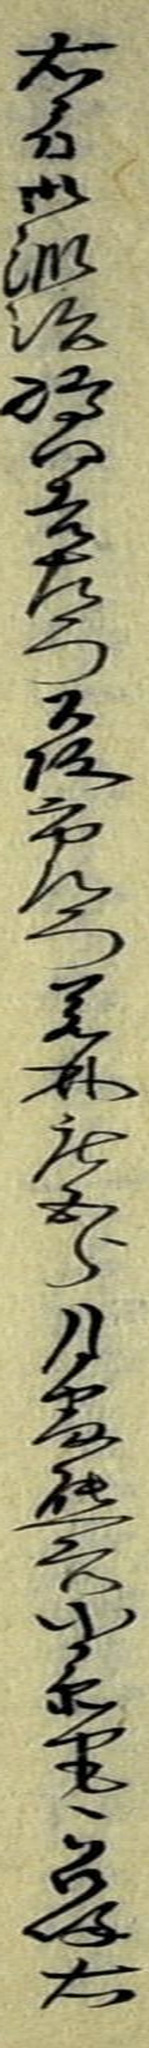右に付御鍛冶嶋田吉左衛門下坂市左衛門若林庄五郎月番熊谷小兵衛宅へ召呼右
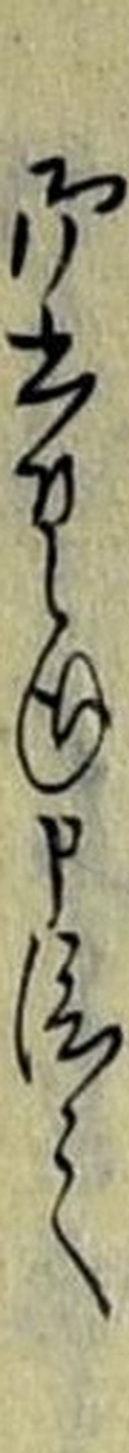御書付之趣申渡之
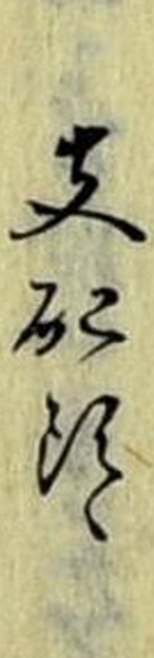支配頭へ
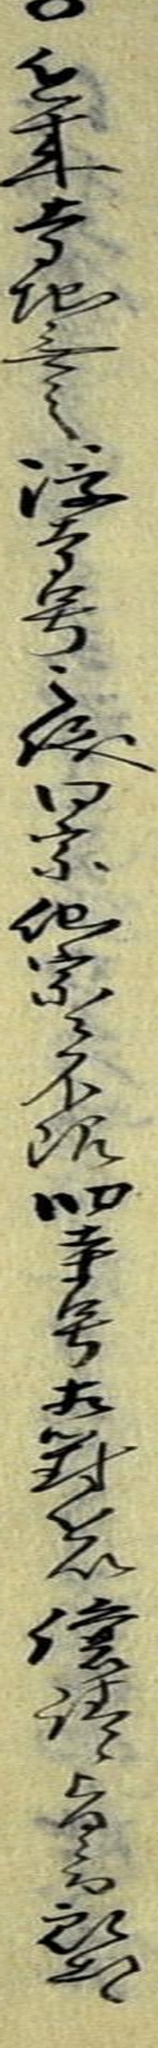〇近来寺地無之浮寺号之儀同宗他宗に不限旧寺号相対を以譲請候旨に而願出候
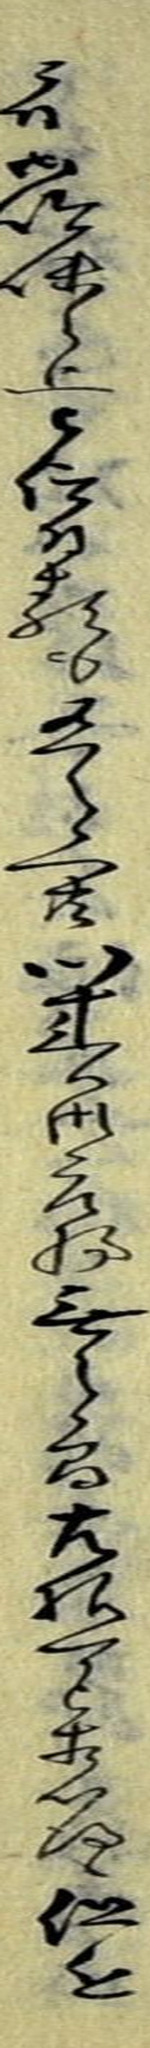に付御吟味之上被仰付類も有之候へ共以来は御取揚無之候間左様可被相心得候但近
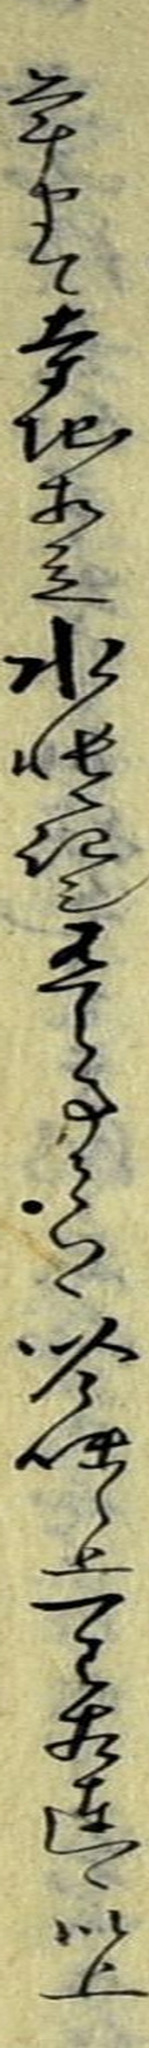年まて寺地相立水帳に記し有之事に候はゝ吟味之上可被相達候以上
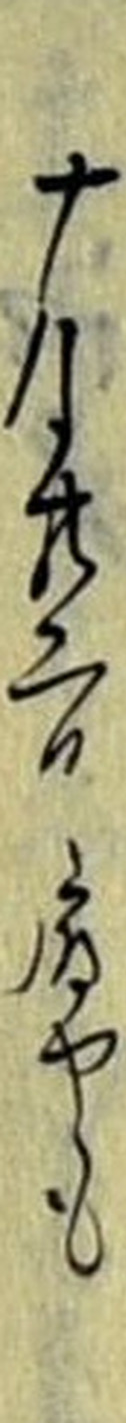十月廿二日府中へも

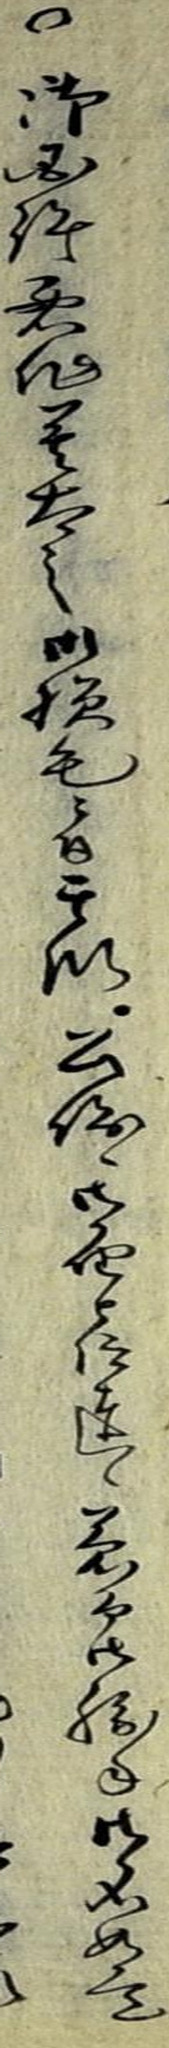〇御国許悪作莫太之御損毛に付其段公儀へ御届被仰達候兼而御勝手御如意
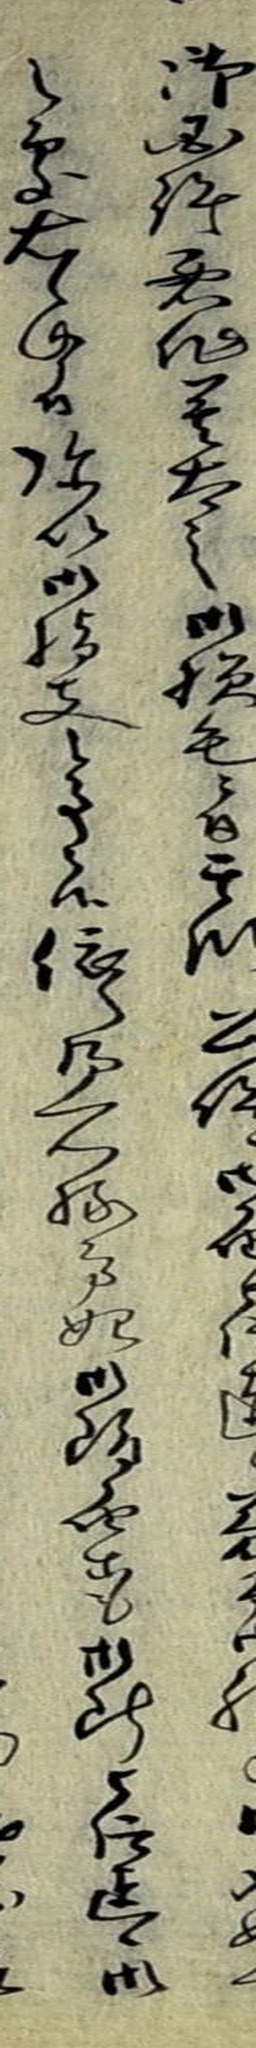之処右之趣に付弥以御指支之事に候依之御一門様方始御附届等も御断被仰達候御
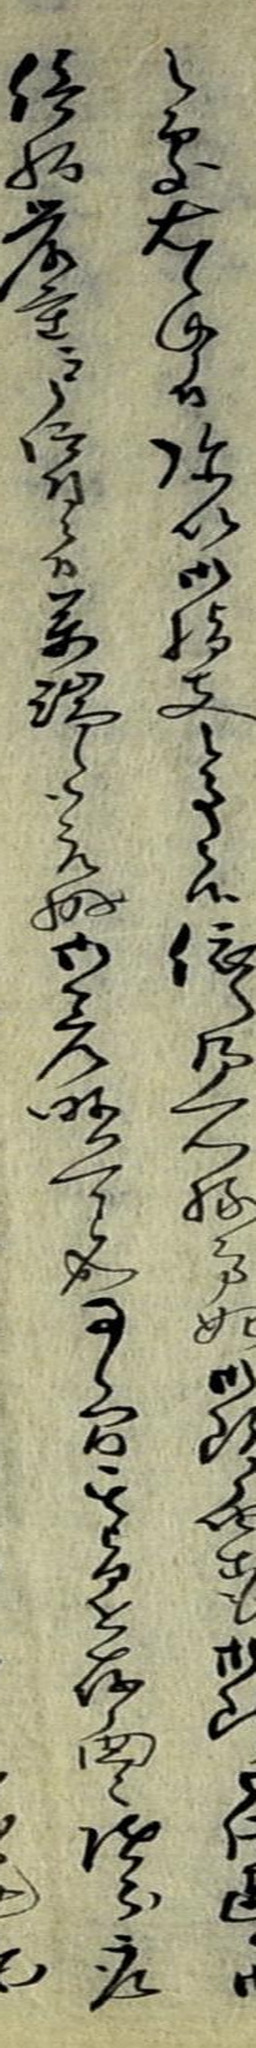倹約厳重に被仰付に付万端之御取扱御差略可被成事候間其旨を存面々随分取
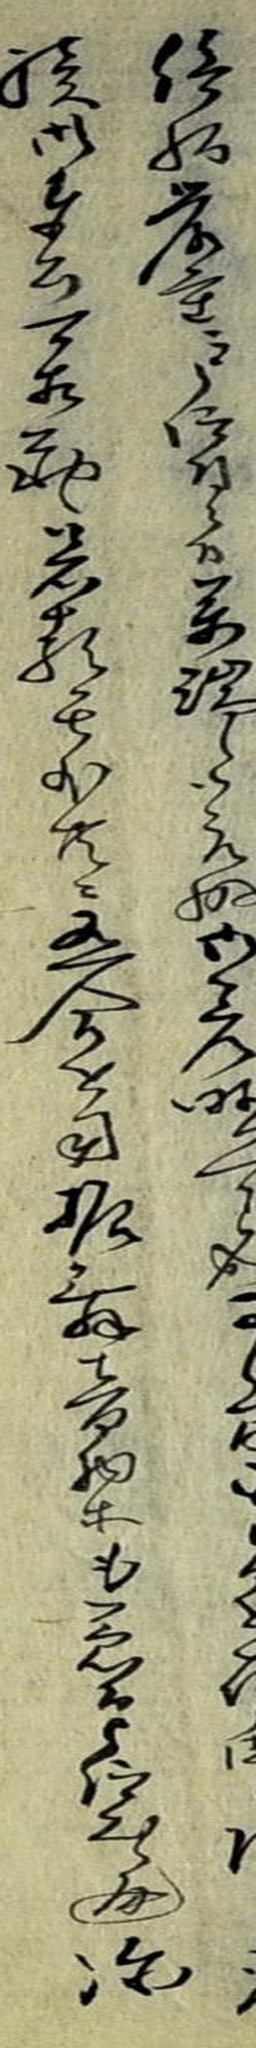続御奉公可相勤候着類其外共に有合を用振舞音物等も兼而被仰出候通弥
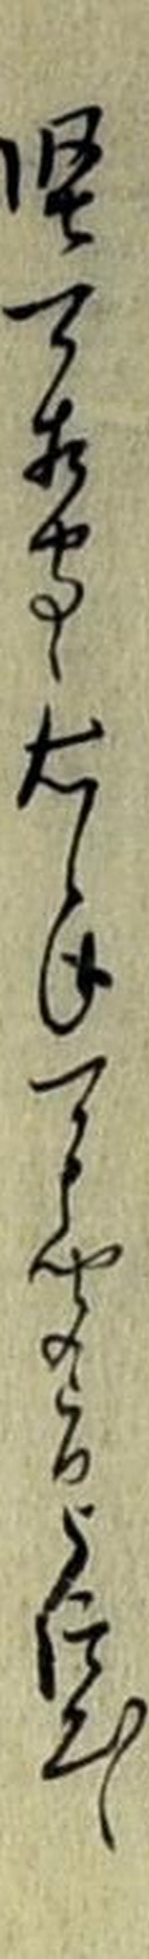堅可相守候右之趣可申聞旨被仰出候
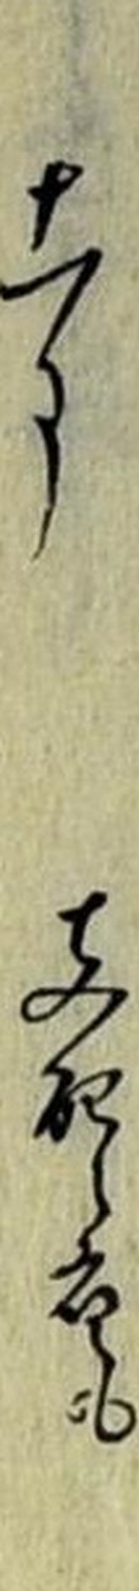十一月支配之者へも
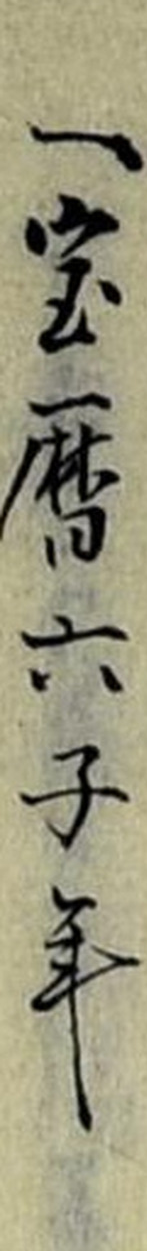一宝暦六子年
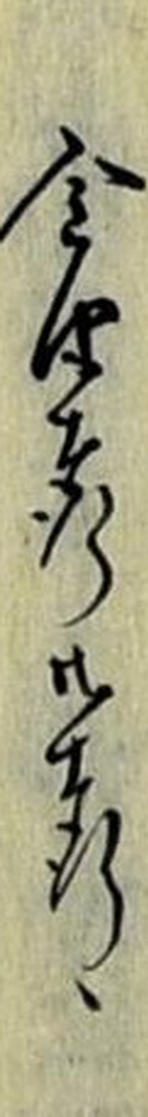金津奉行御奉行へ
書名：命令之部 二
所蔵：福井県文書館 Fukui Prefectural Archives
